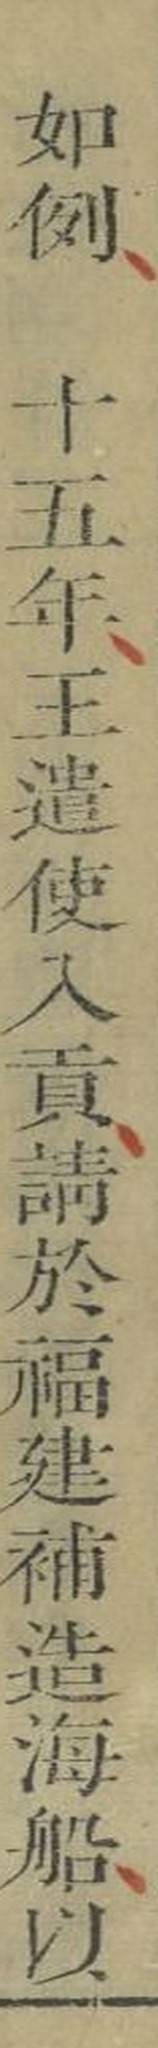如例十五年王遣使入貢請於福建補造海船以
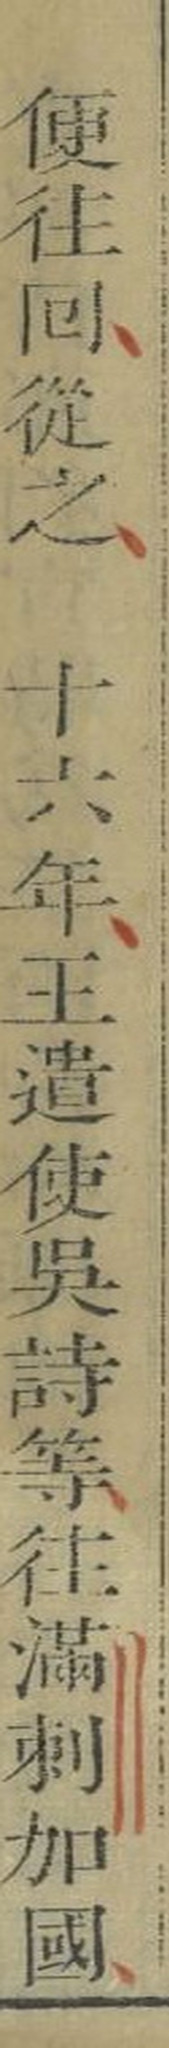便往回従之十六年王遣使呉詩等往満刺加国
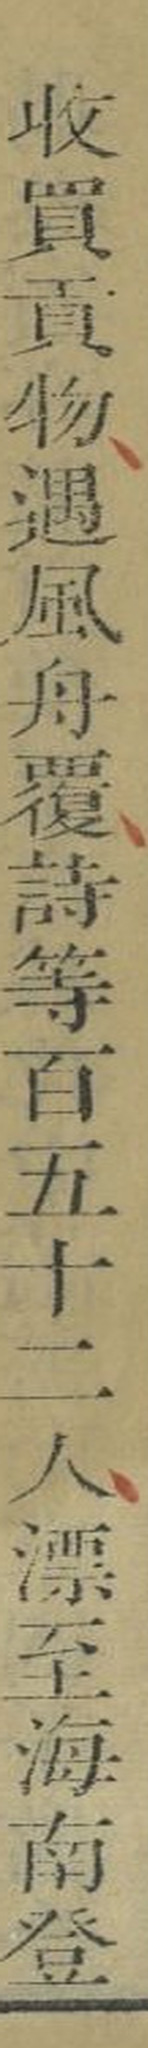収買貢物遇風舟覆詩等百五十二人漂至海南登
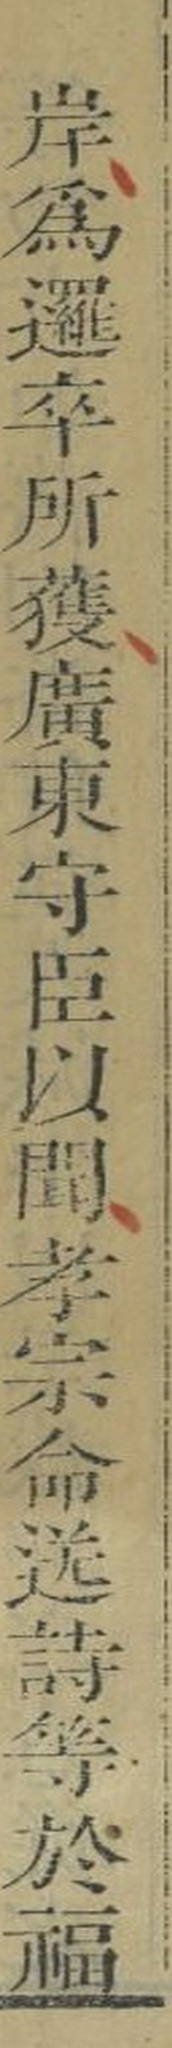岸為邏卒所獲広東守臣以聞孝宗命送詩等於福
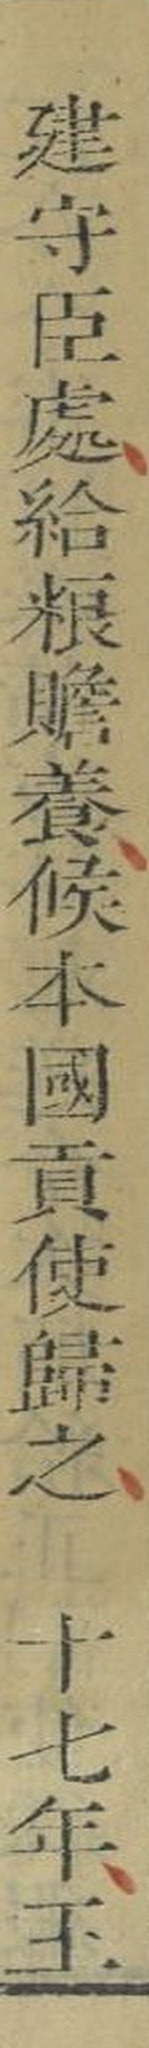建守臣処給粮贍養候本国貢使帰之十七年王
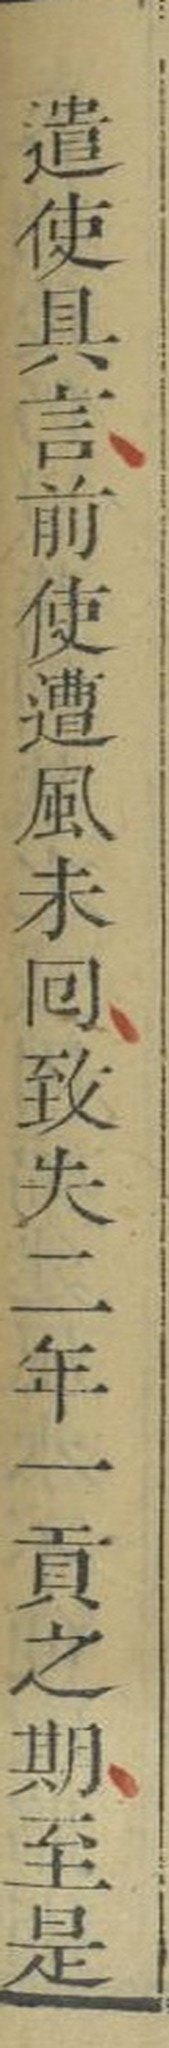遣使具言前使遭風未回致失二年一貢之期至是
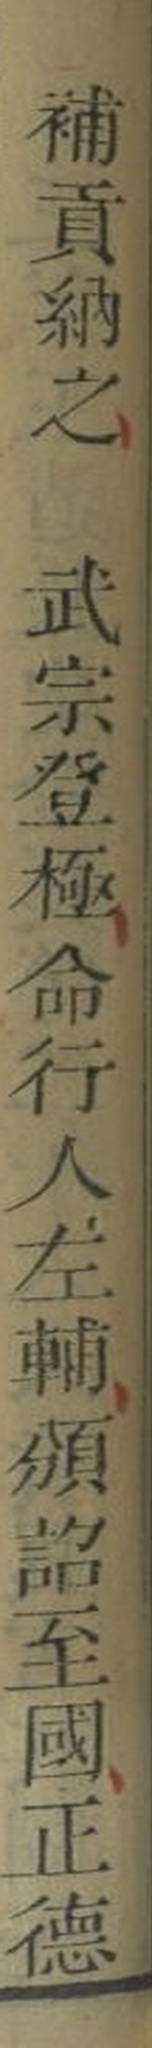補貢納之武宗登極命行人左輔頒詔至国正徳
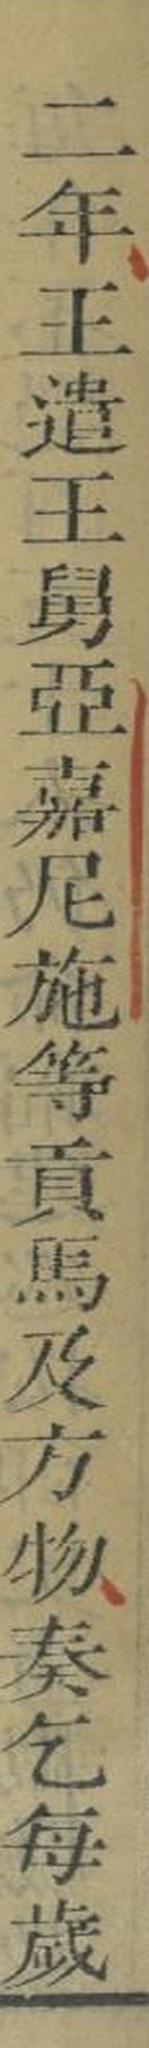二年王遣王舅亜嘉尼施等貢馬及方物奏乞毎歳
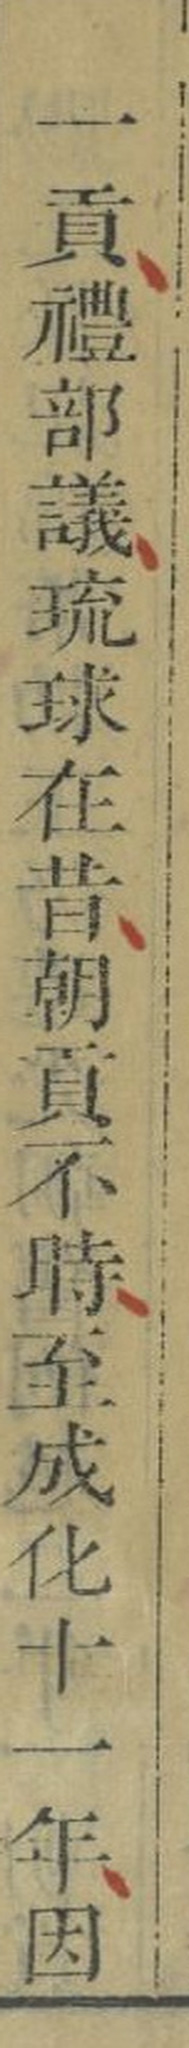一貢礼部議琉球在昔朝貢不時至成化十一年因
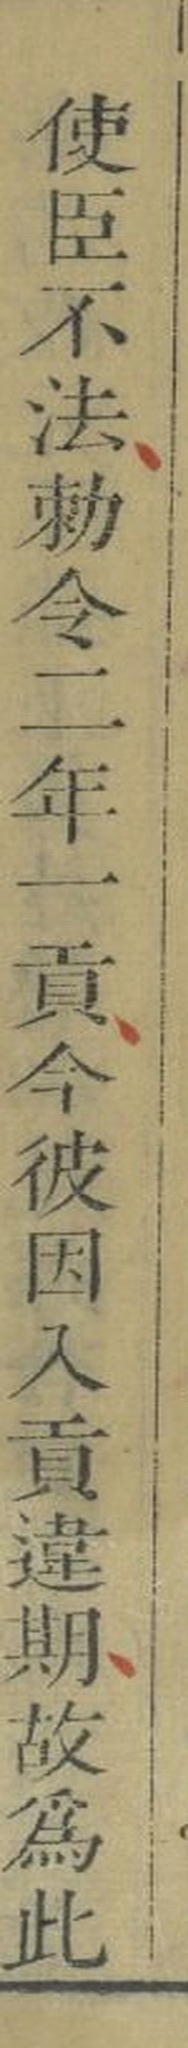使臣不法勅令二年一貢今彼因入貢違期故為此
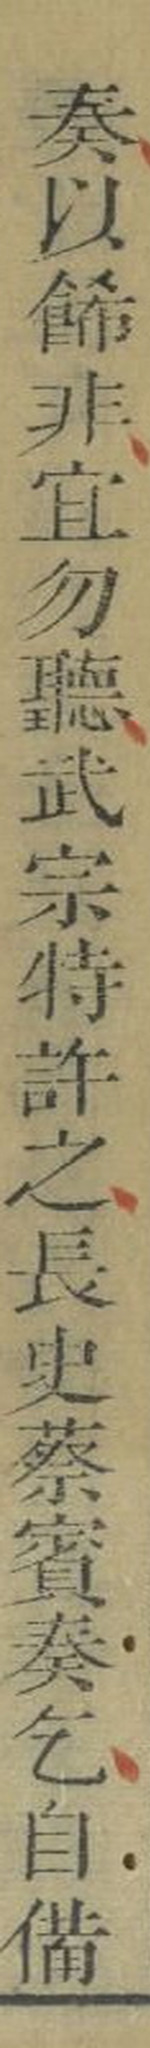奏以飾非宜勿聴武宗特許之長史蔡賓奏乞自備
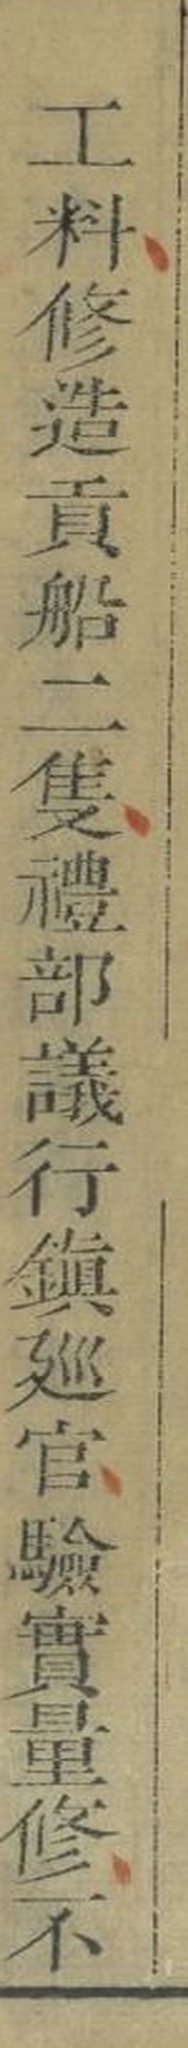工料修造貢船二隻礼部議行鎮巡官験実量修不
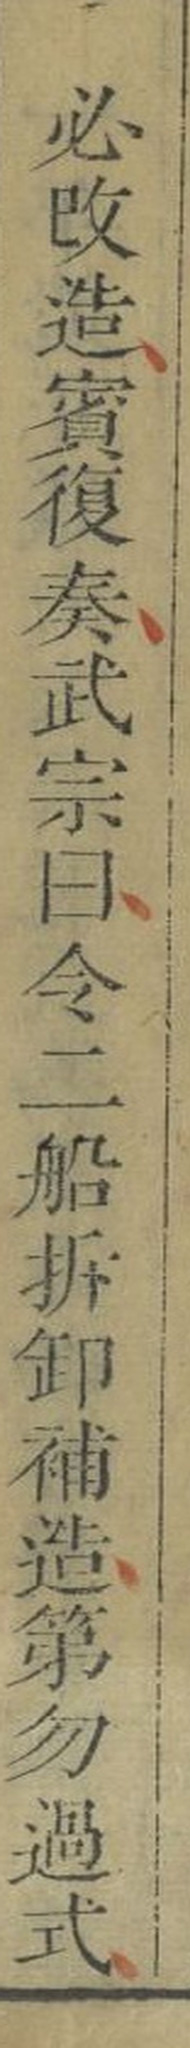必改造賓復奏武宗曰令二船拆卸補造第勿過式
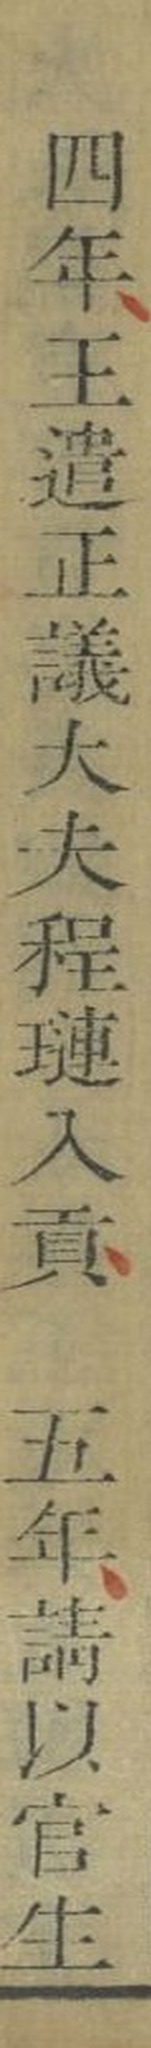四年王遣正議大夫程璉入貢五年請以官生
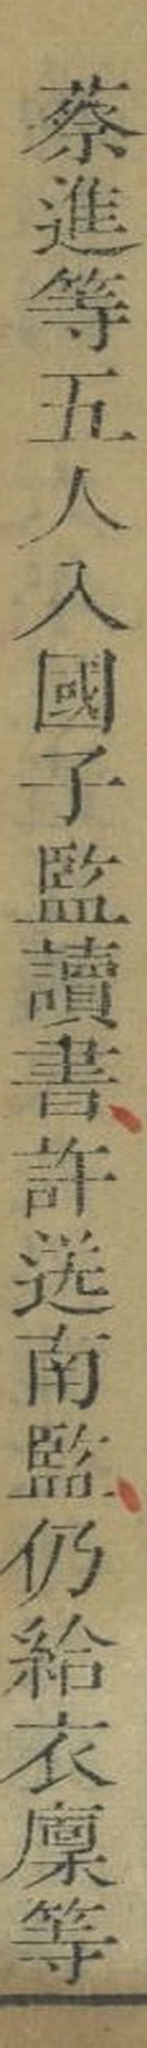蔡進等五人入国子監読書許送南監仍給衣廩等

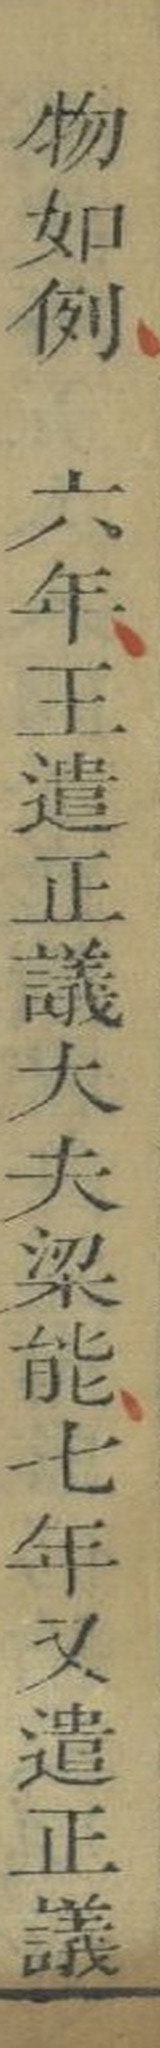物如例六年王遣正議大夫梁能七年又遣正議
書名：中山伝信録 巻三
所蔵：University of the Ryukyus Library
